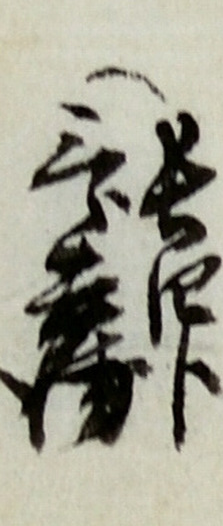三郎兵衛

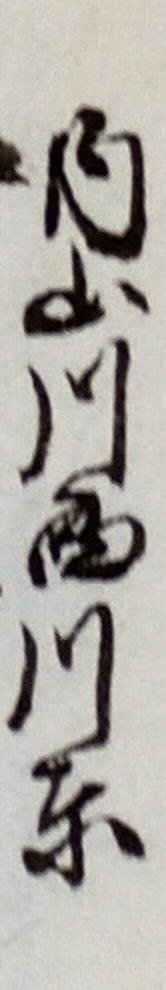内山川西川東
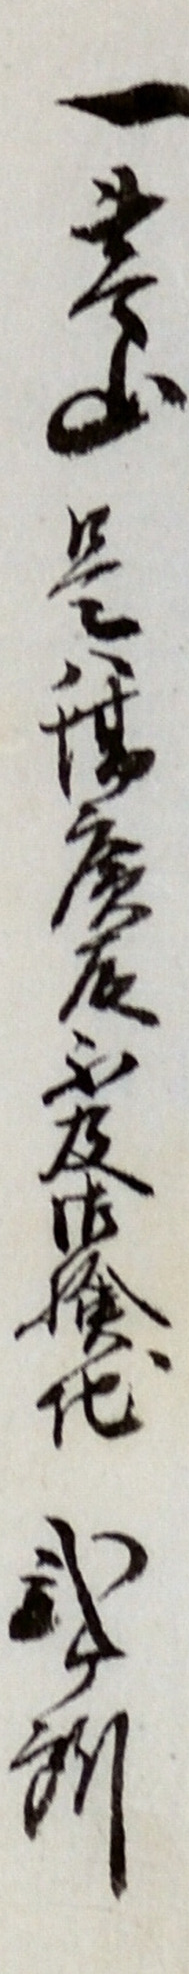一芝山是ハ場広故不及御検地弐ヶ所
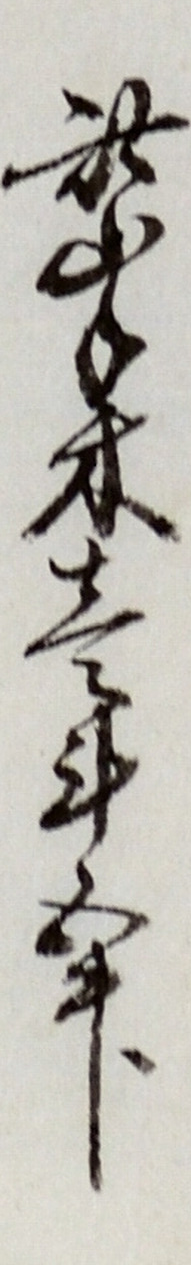此山手米壱斗五升
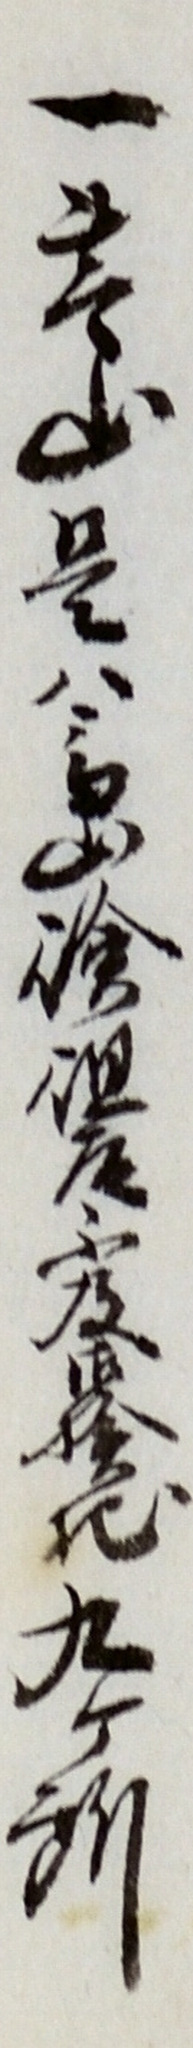一芝山是ハ高山嶮阻故不及御検地九ヶ所
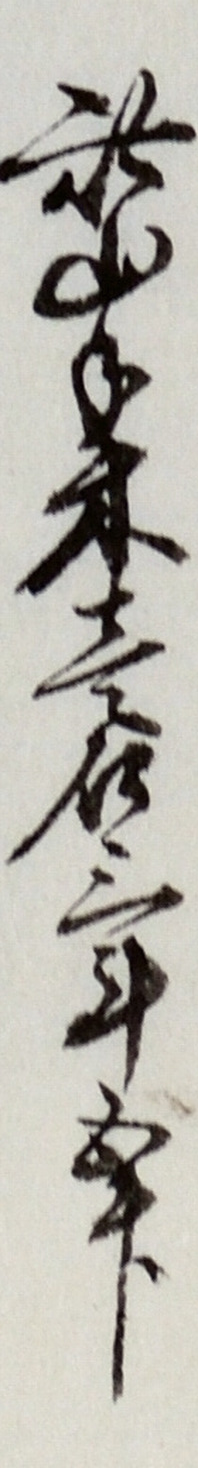此山手米壱石三斗五升
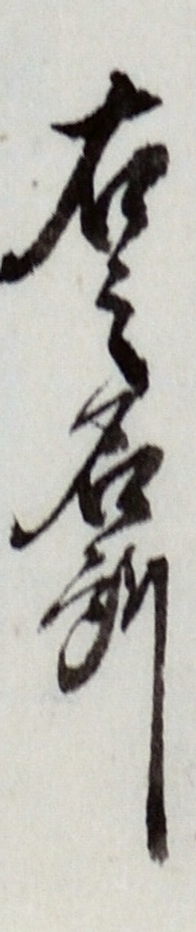右之名所
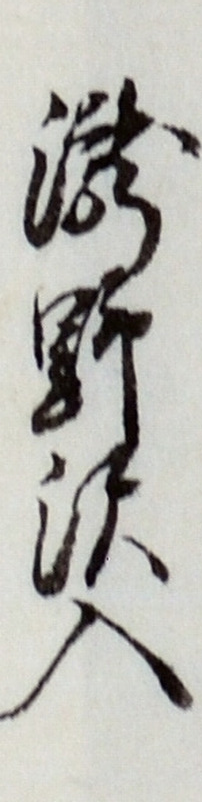瀧野沢入
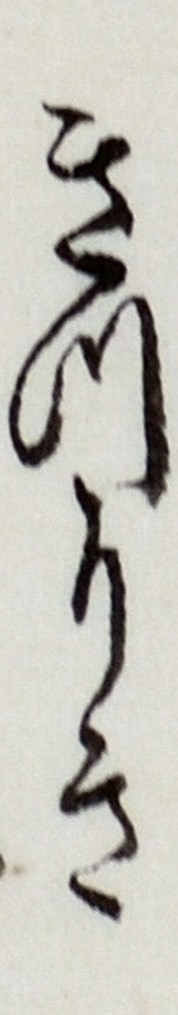きつにき
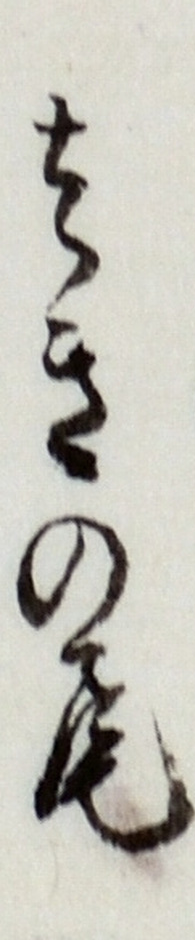はきの尾
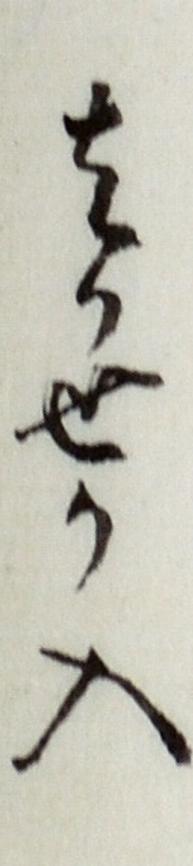はかせか入
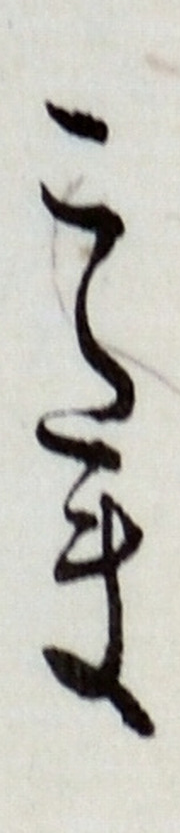こたま
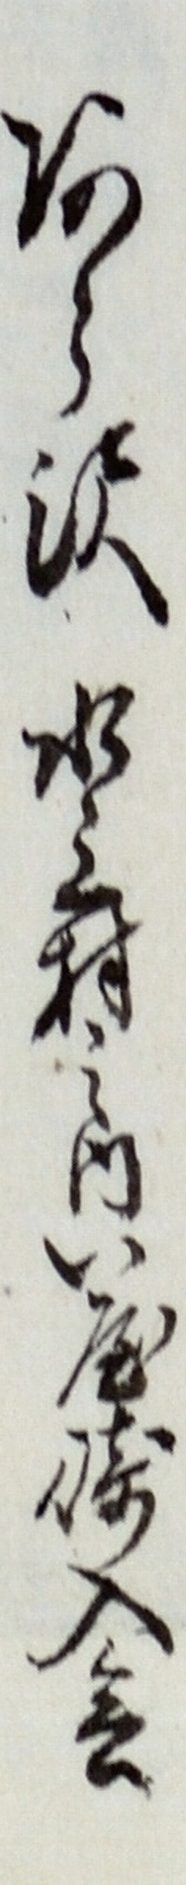あら沢水上村之内いや崎入会
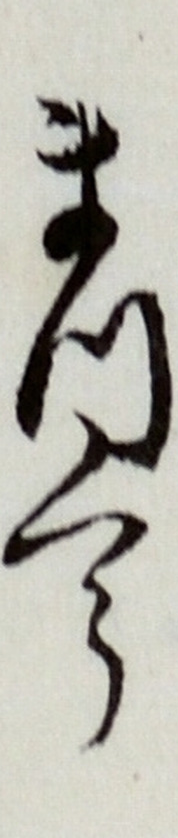まつくら
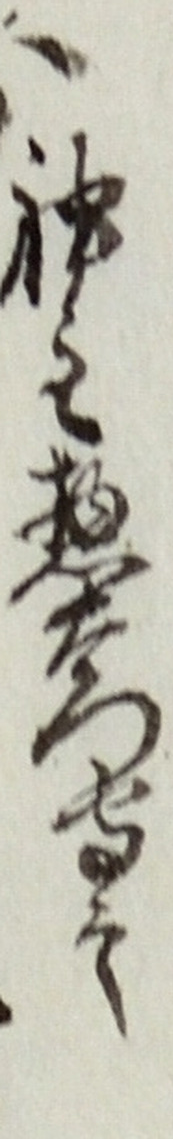神主惣右衛門守之
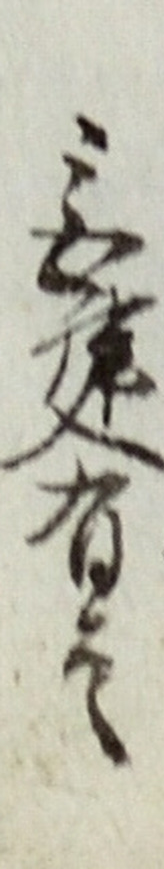宮建有之
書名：御領分中山林社地手控
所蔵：伊那市立高遠町図書館・合同会社AMANE
